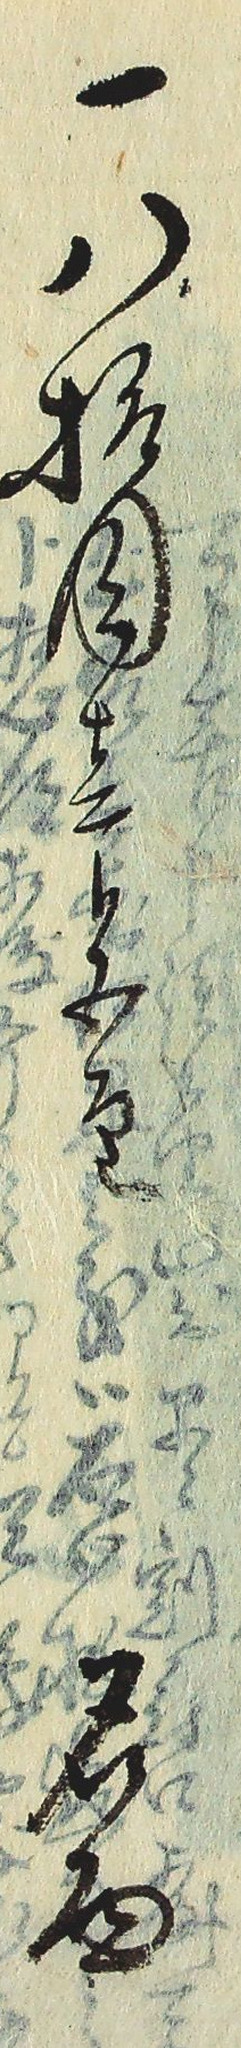一八拾目壱分五厘名西
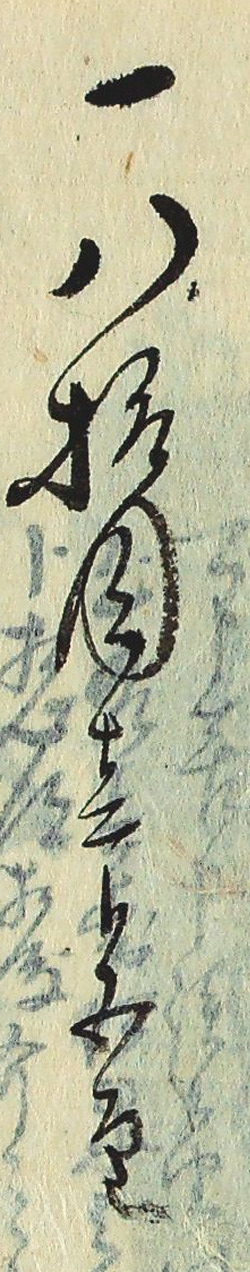八拾目壱分五厘
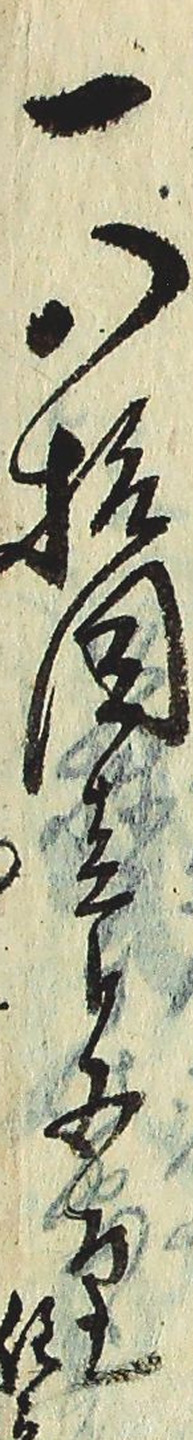一八拾目壱分五厘勝浦
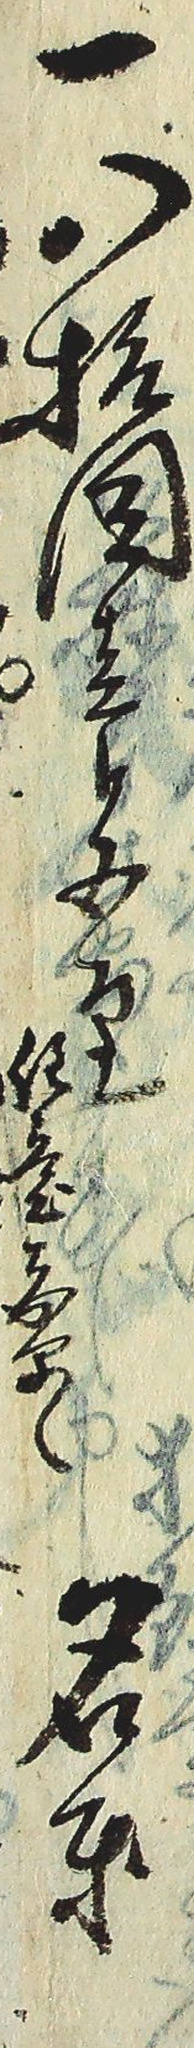一八拾目壱分五厘名東
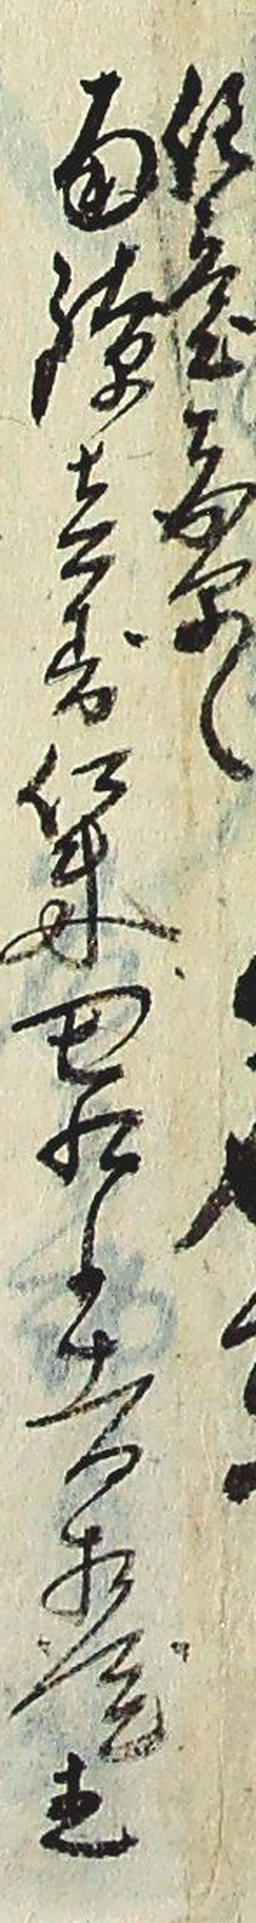南鐐壱歩仁朱丑九月十一日相渡直
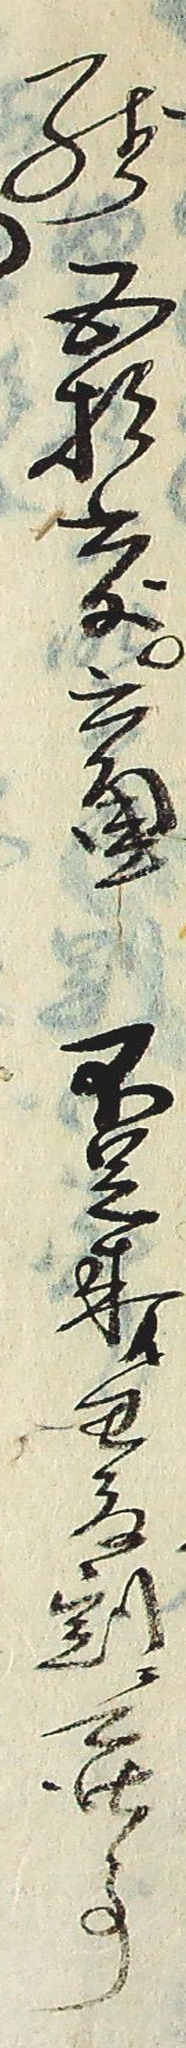残り五拾六匁六厘不足来る丑高割に可仕事

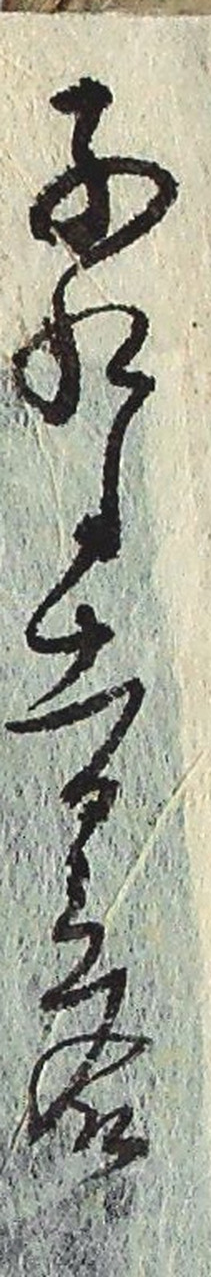子九月十一日立合
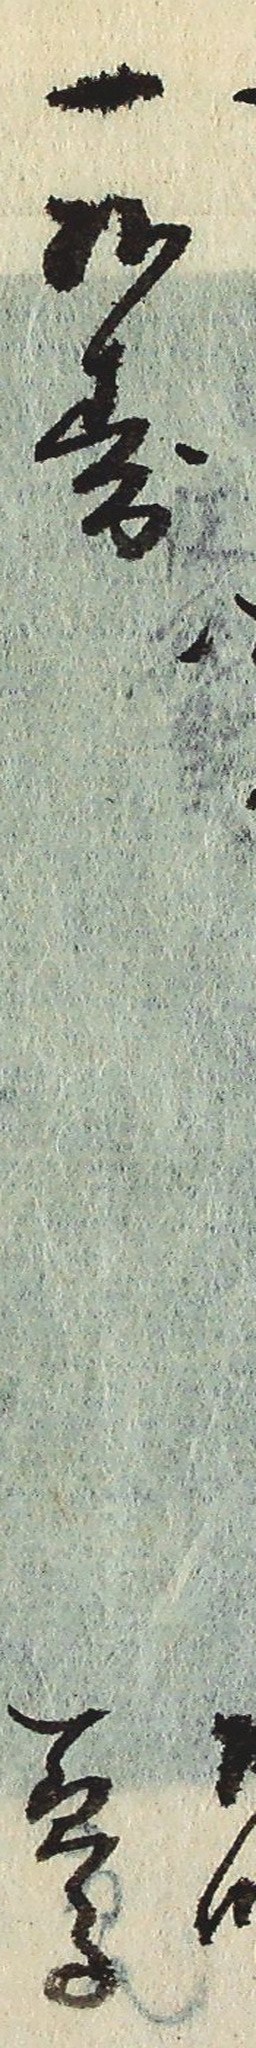一弐歩美馬
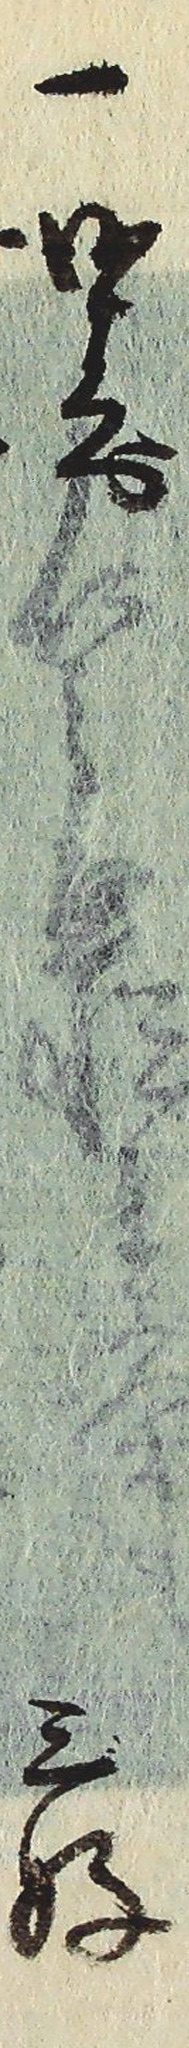一弐歩三好
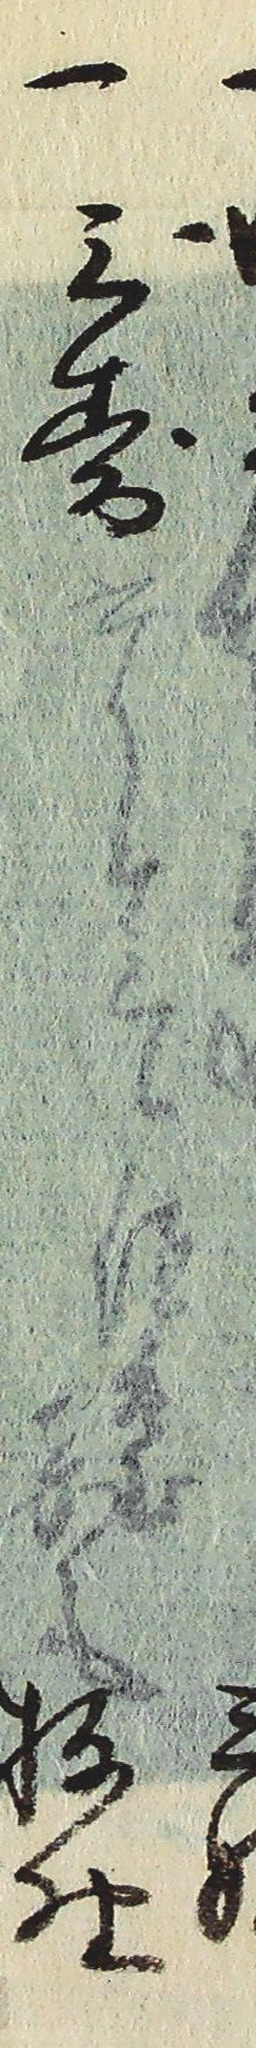一三歩板野
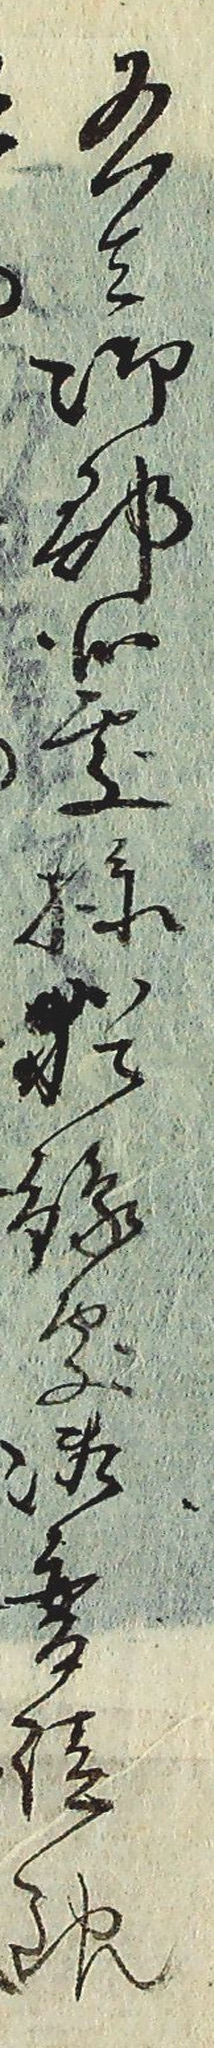右は御郡代処様猶予処御普請銀
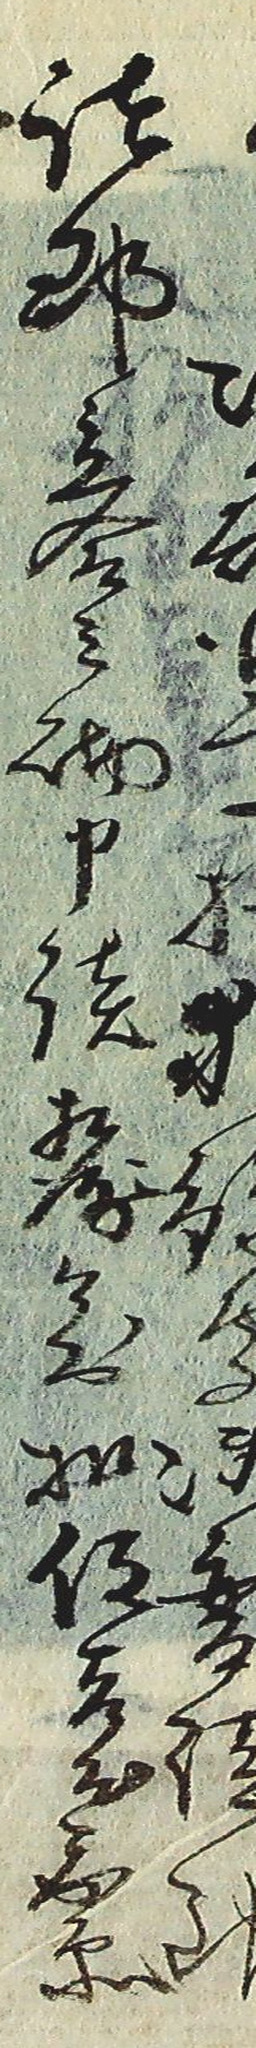諸郡立合之砌申談相渡候分扣住吉屋嘉兵衛
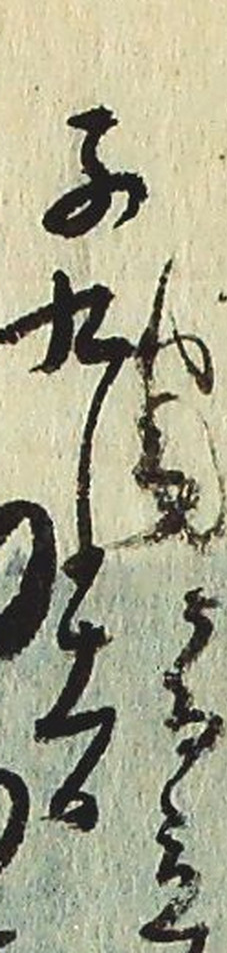子九月十一日
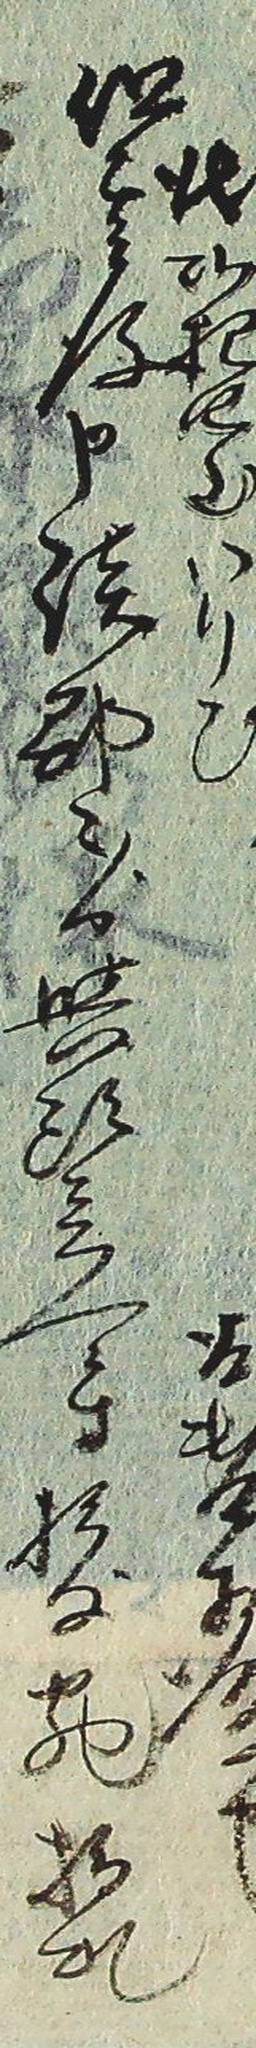但其後申談郡々ゟ与頭壱人に付拾匁宛指出し
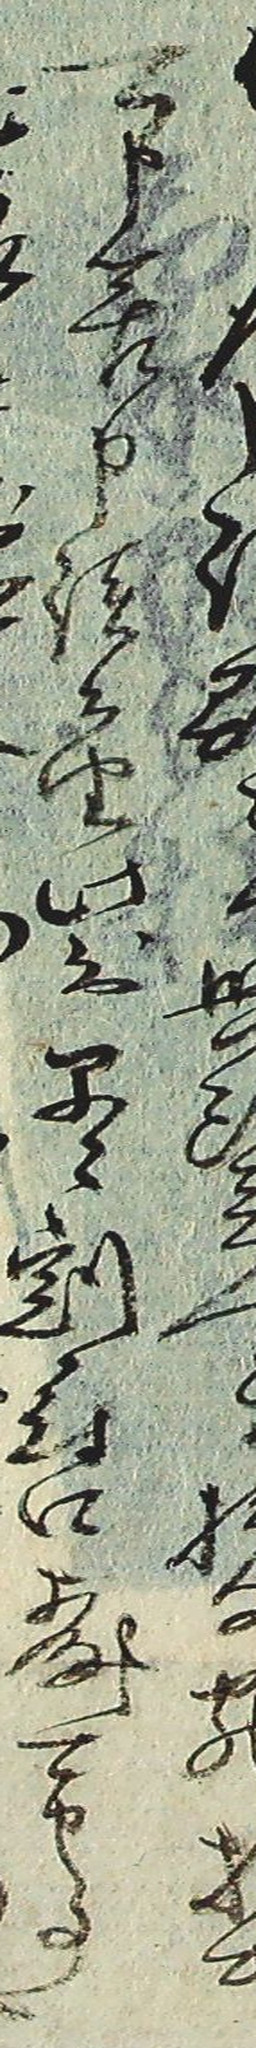可申筈申談候由此分早々割苻仕度可申事
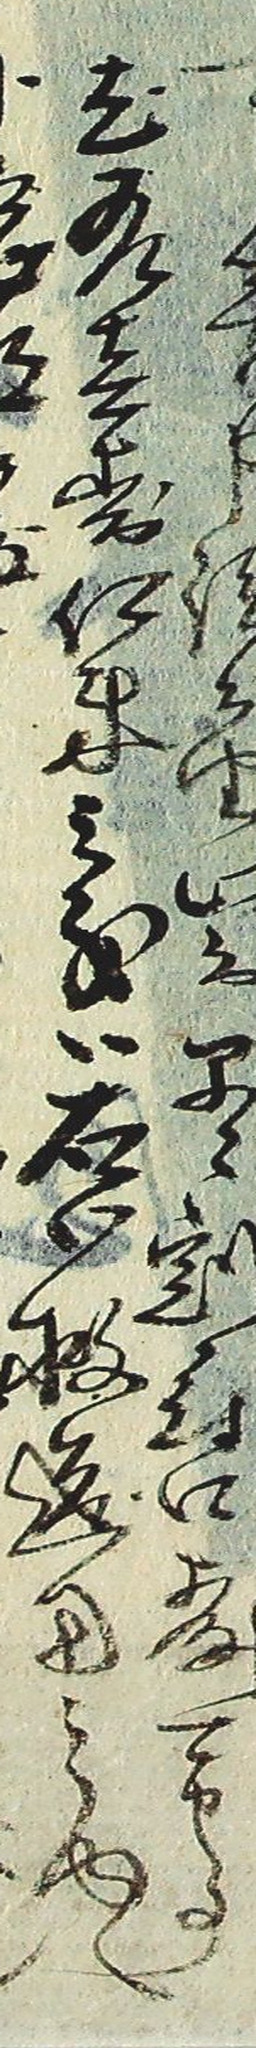尤右壱歩仁朱之義は右御救造用之内へ
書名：名東郡中諸割賦元帳
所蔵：鳴門教育大学 Naruto University of Education
